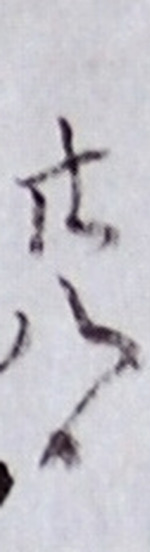廿八日
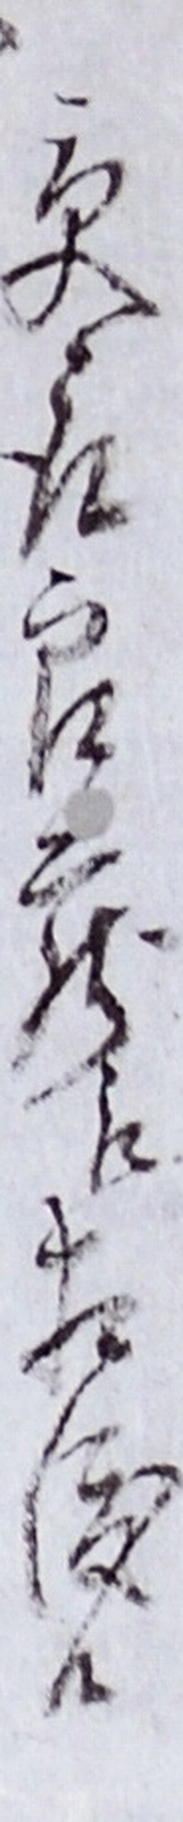受取良蔵江相渡候
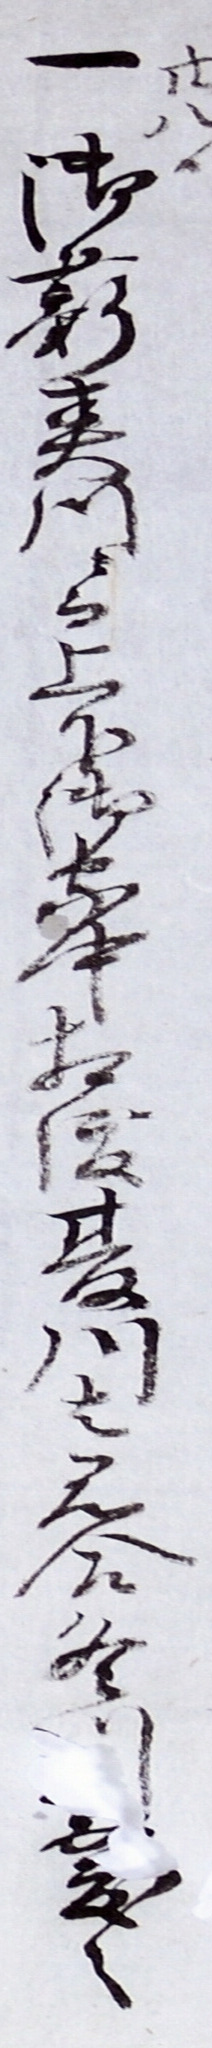一御薪春川ニ而上下御家中相渡夏川は見合冬川度之
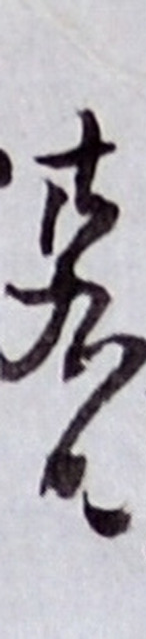廿九日
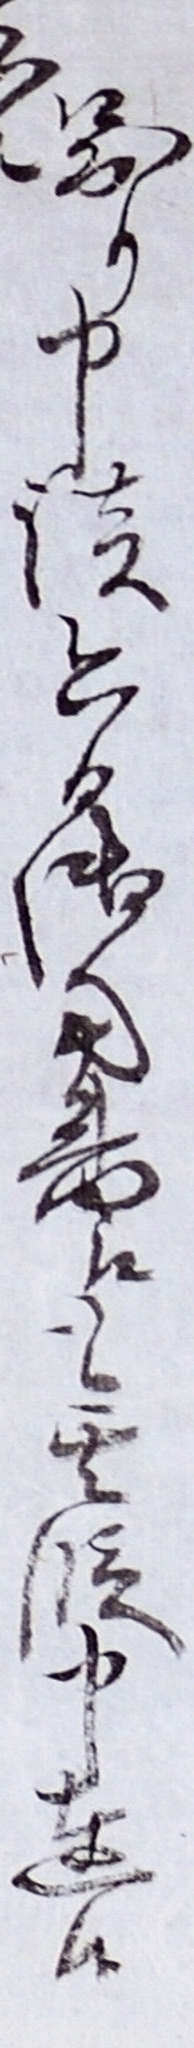図り申談今日御用番江も其段申達候
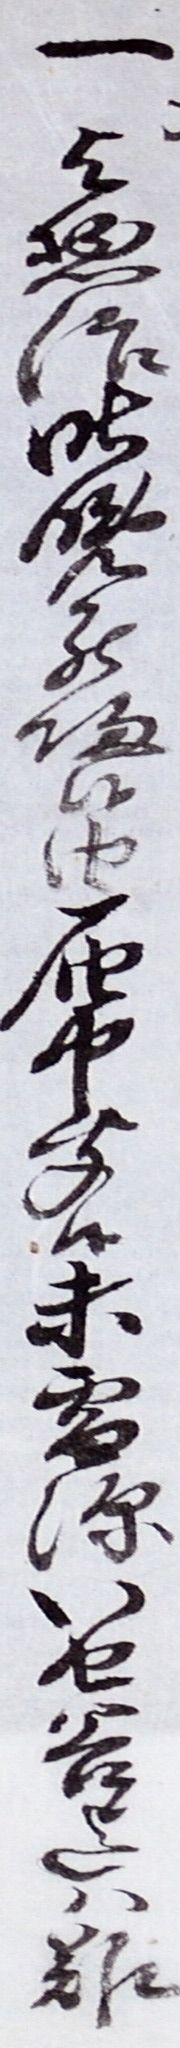一与惣治昨晩罷帰候由届申聞候未雪深いせ谷迄は難
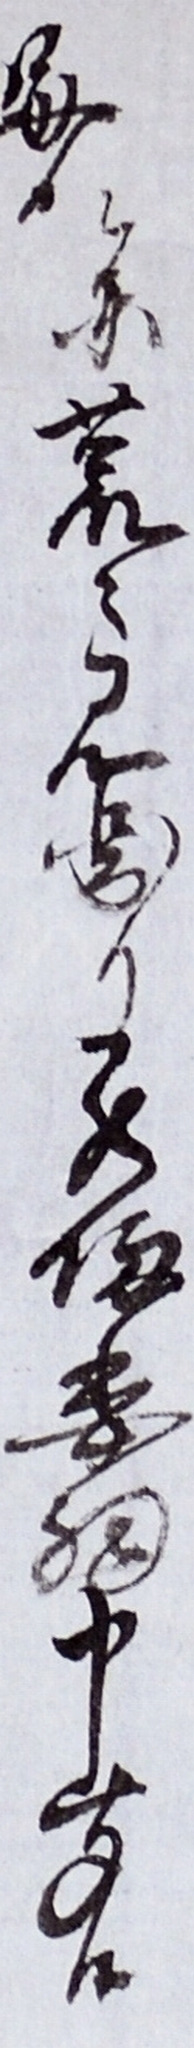候亦荒々見図り罷帰委細申聞候
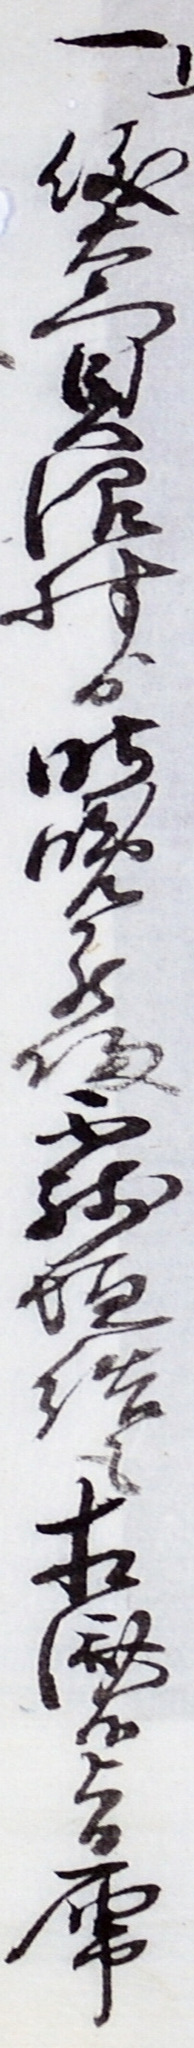一儀右衛門貝沼村ゟ昨晩罷帰不残垣結も相済候旨届申
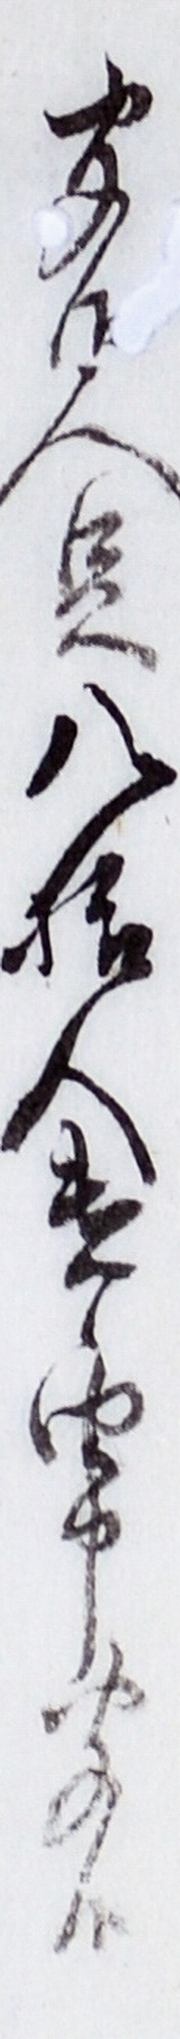聞候人足八拾人遣候由申聞候
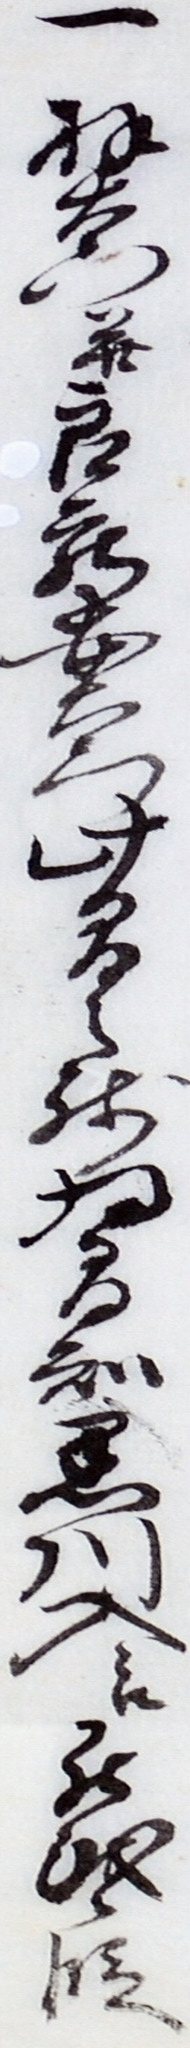一羽右衛門并良蔵安右衛門此間之残為尋知黒川入江罷越候段
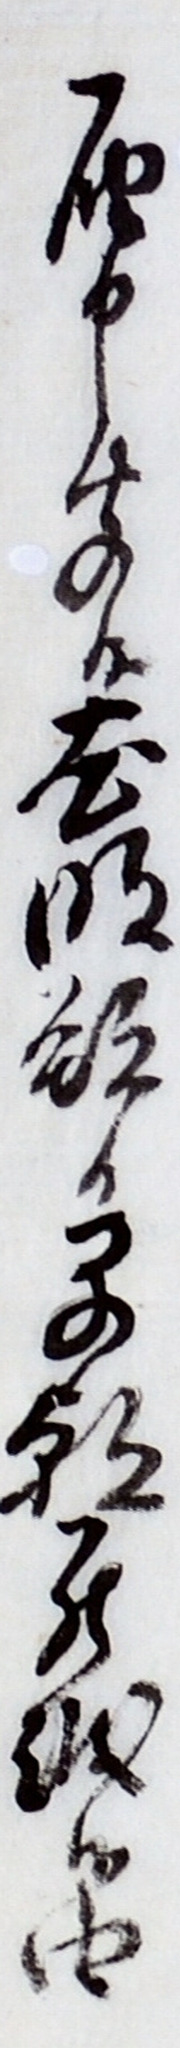届申聞候尤明朔日早朝罷越候由
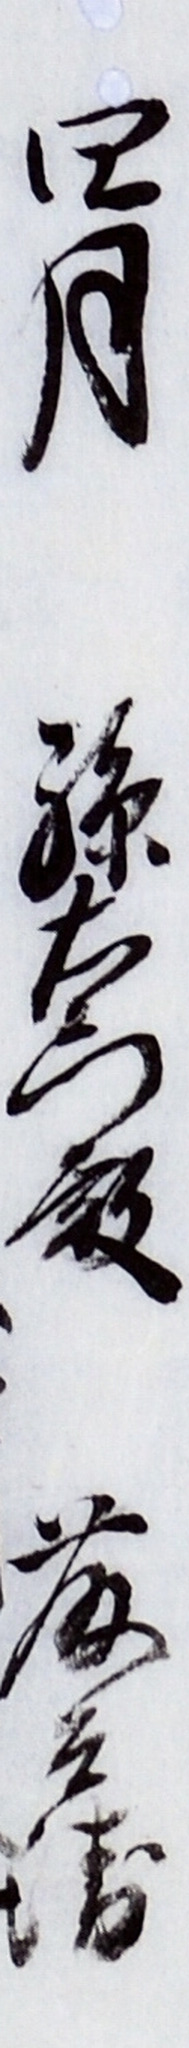四月孫右衛門殿藤兵衛
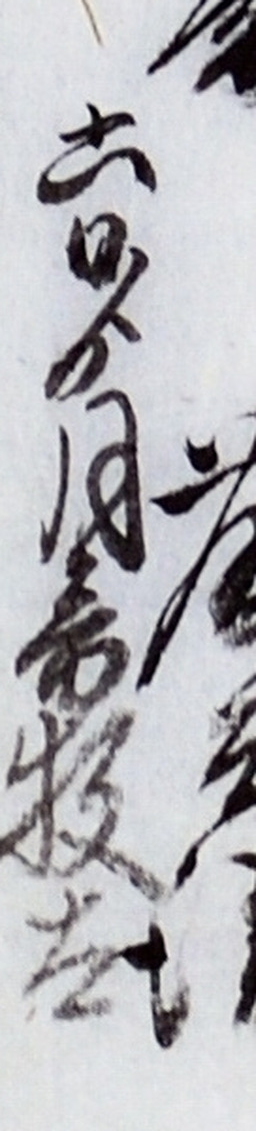六日ゟ月番牧太
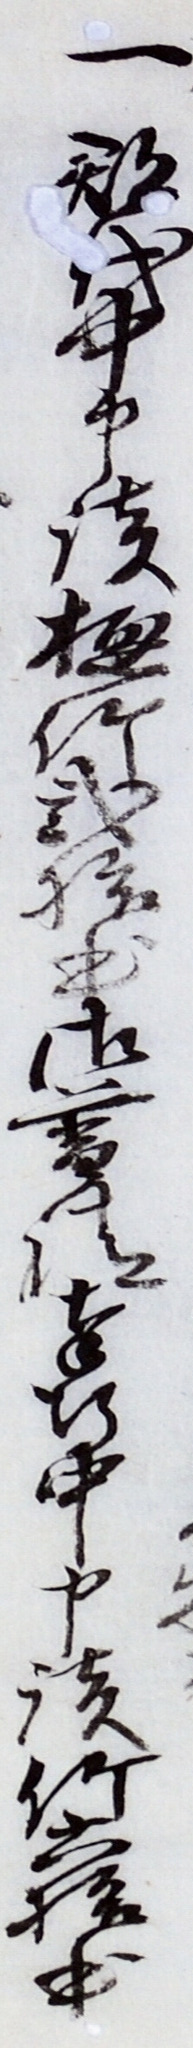一郡代中申談樋竹弐拾本御普請奉行中申談竹六拾本
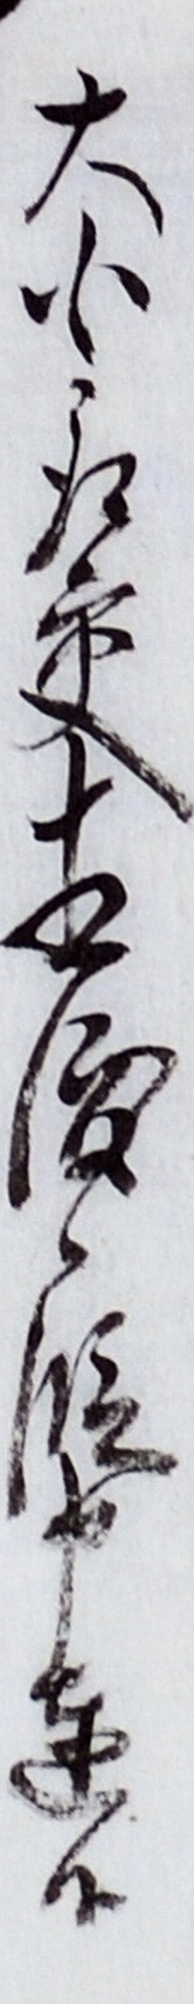大小取交相渡候段申達候
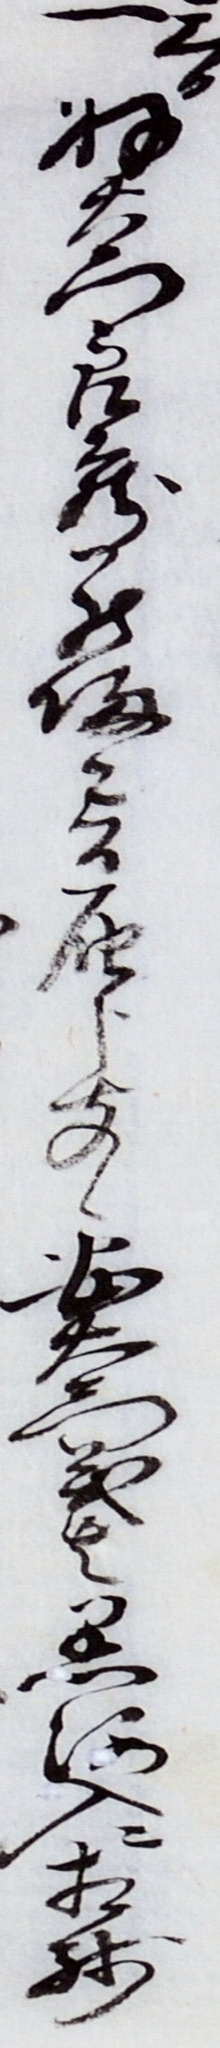一羽右衛門良蔵罷帰候旨届申聞候安右衛門義は黒河入ニ相残
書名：御山奉行御用控
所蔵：伊那市立高遠町図書館・合同会社AMANE
